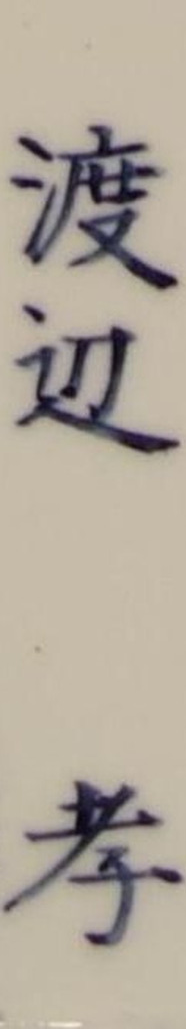渡辺孝
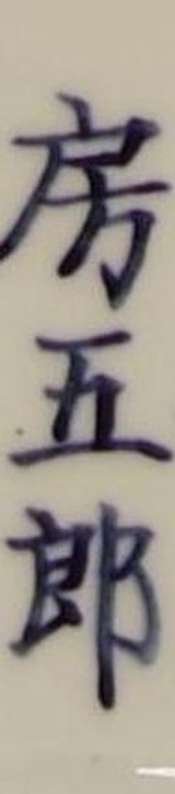房五郎
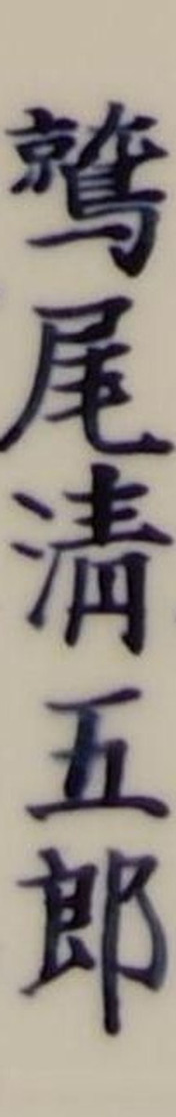鷲尾清五郎
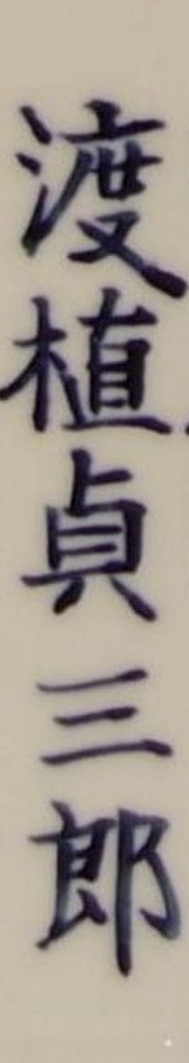渡植貞三郎
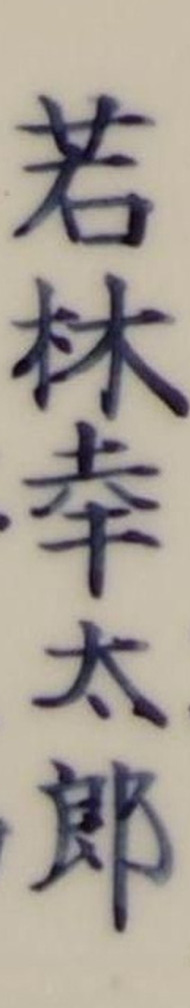若林幸太郎
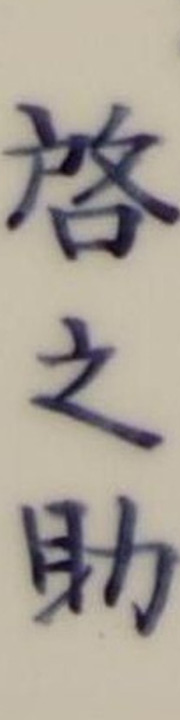啓之助
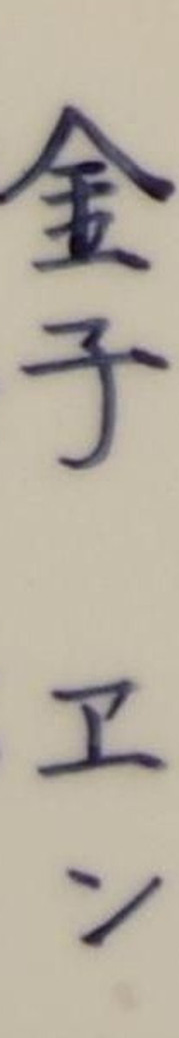金子エン
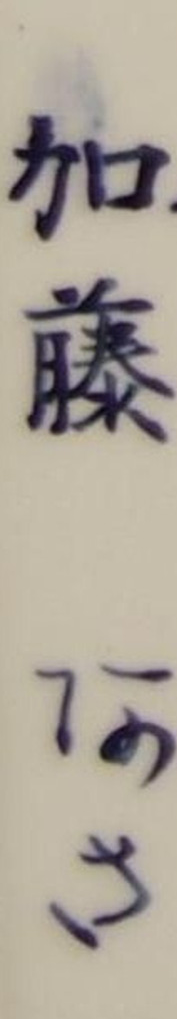加藤あさ

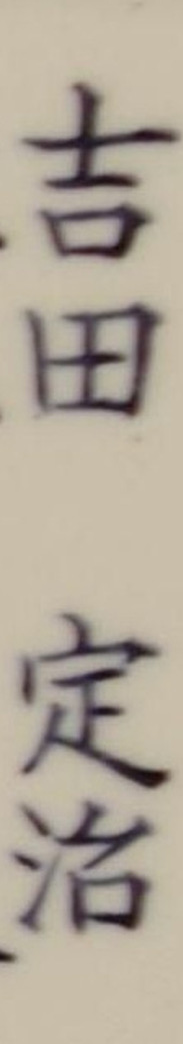吉田定治
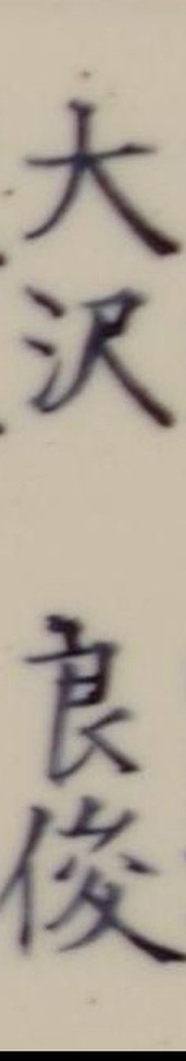大沢良俊
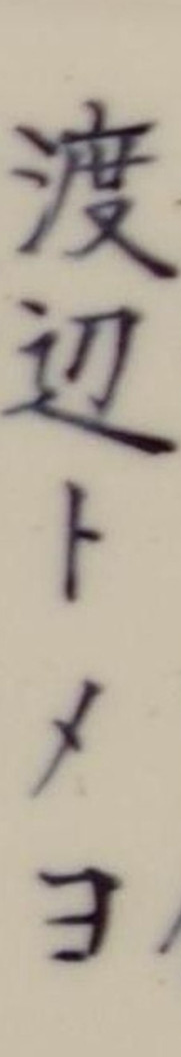渡辺トメヨ
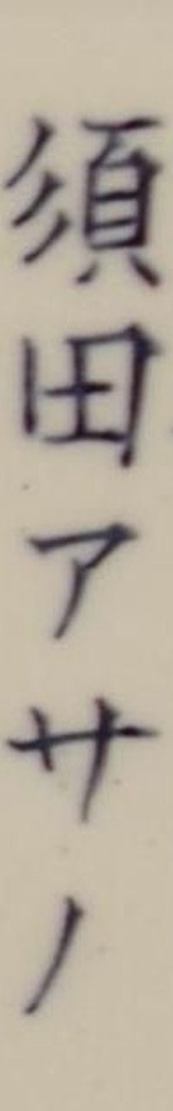須田アサノ
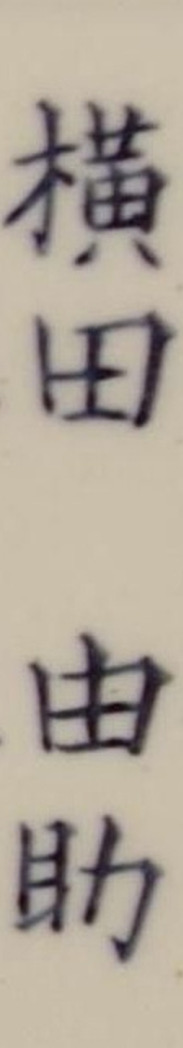横田由助
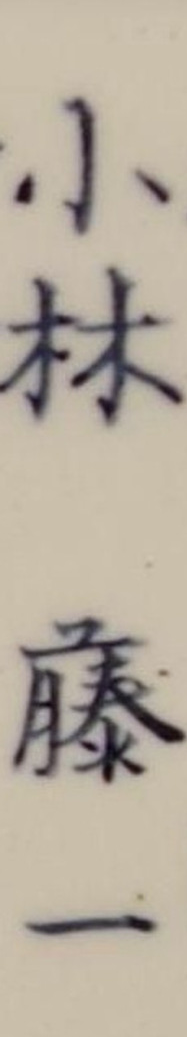小林藤一
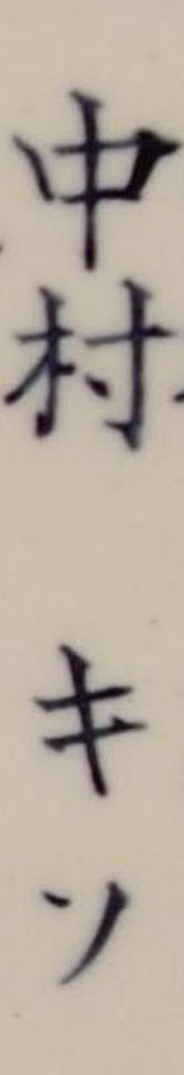中村キソ
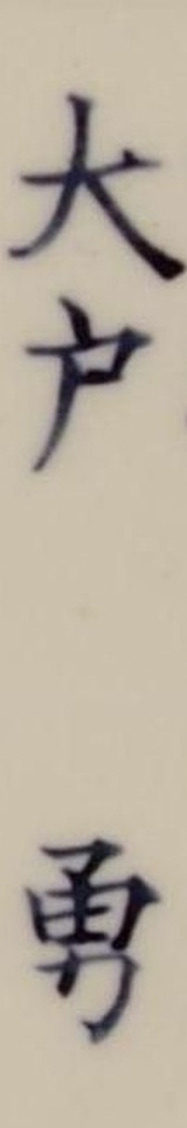大戸勇
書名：E~L
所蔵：高野山金剛峯寺
